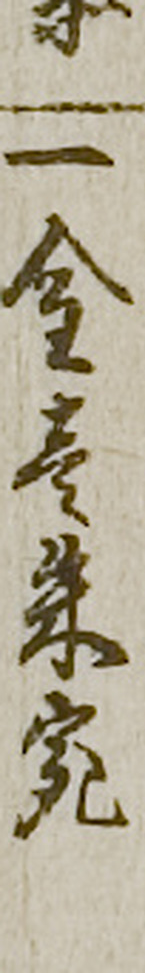一金壱朱宛
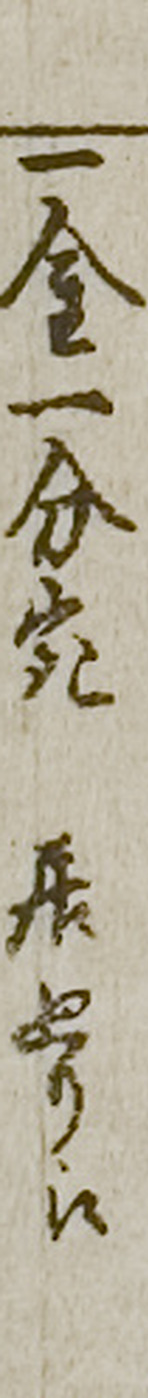一金一分宛居廻り江
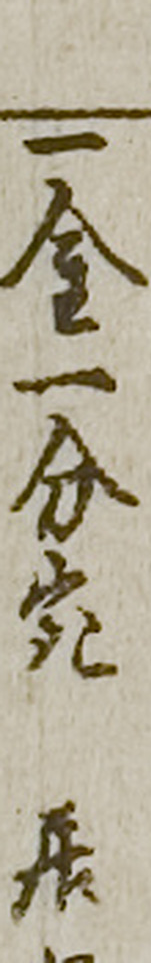一金壱朱宛
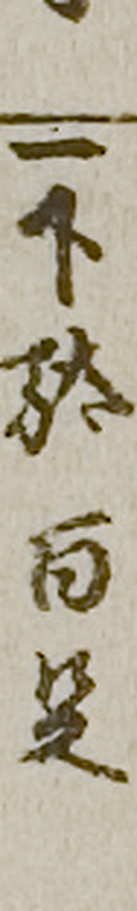一下駄百足
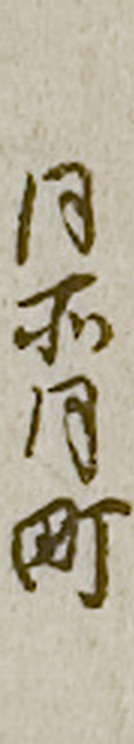同所同町
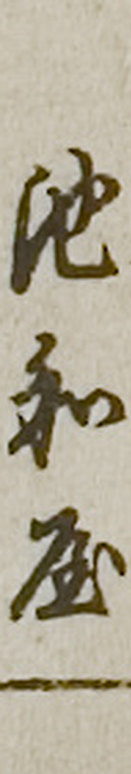池田屋
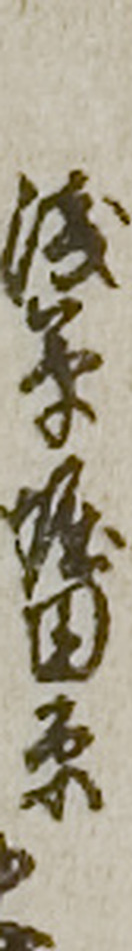浅草堀田原
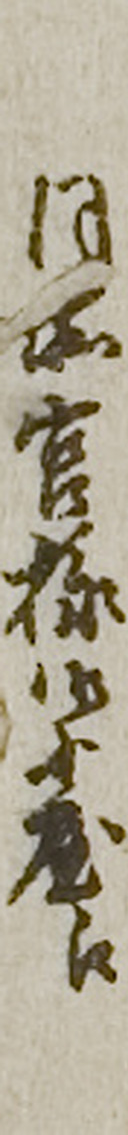同所宮様御小屋江
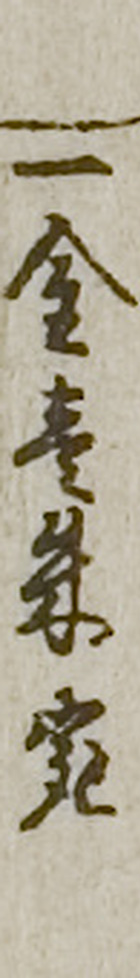一金壱朱宛
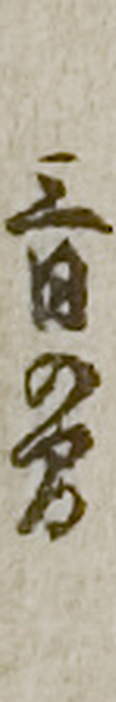三日の間
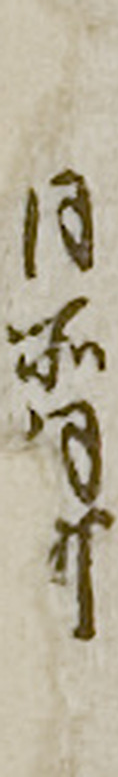同所同町
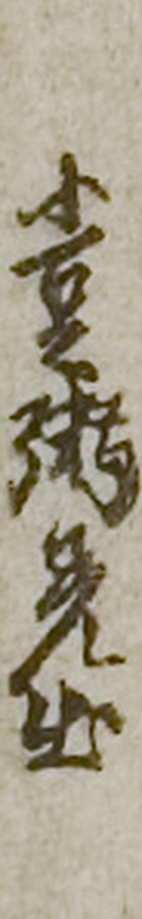小豆粥差出
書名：地震出火御救小屋施行名前附
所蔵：東京大学総合図書館 General Library in the University of Tokyo, JAPAN
